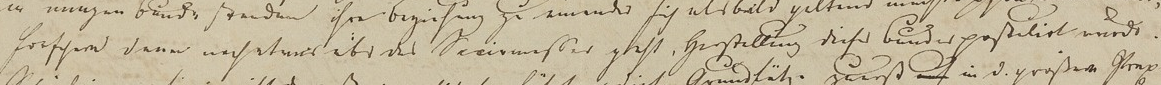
forschern denen noch etwas über das Secirmesser geht, Herstellung dieses Bundes postulirt wurde.
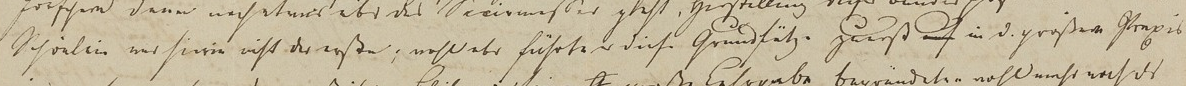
Schönlein war hierin nicht der erste; wohl aber führte er diese Grundsätze zuerst auch in d. größere Praxis
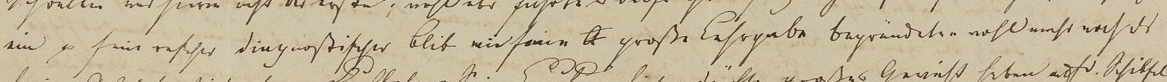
ein & sein rascher diagnostischer Blik wie seine große Lehrgabe begründeten wohl mehr noch als
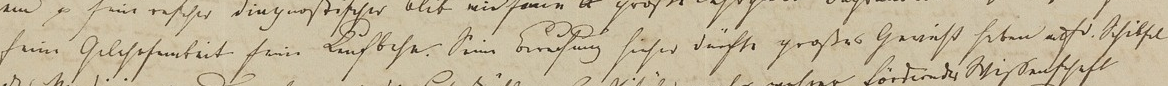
seine Gelehrsamkeit seine Laufbahn. Seine Berufung hieher dürfte großes Gewicht haben auf d. Schiksal
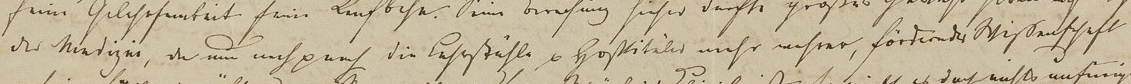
der Medizin, da nun nach & nach die Lehrstühle & Hospitäler mehr wahrer, fördernder Wissenschaft
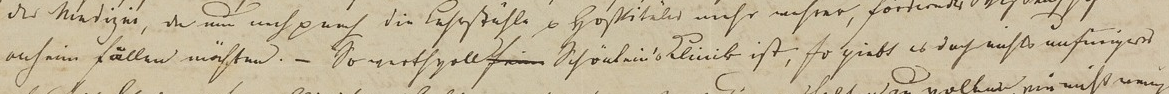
anheim fallen möchten. – So werthvoll seineSchönlein's Klinik ist, so giebt es doch nichts unsinnigeres
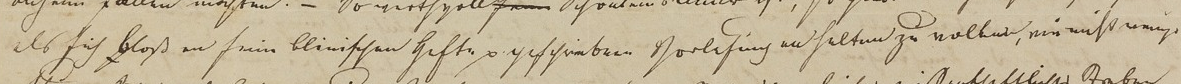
als sich bloß an seine klinischen Hefte & geschriebnen Vorlesungen halten zu wollen, wie nicht wenige
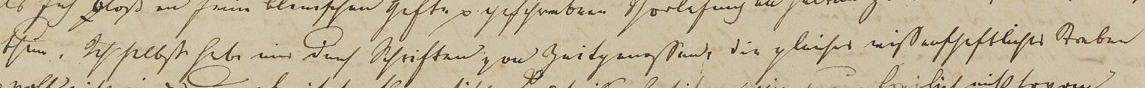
thun. Ich selbst habe mir durch Schriften von Zeitgenossen, die gleiches wissenschaftliches Streben
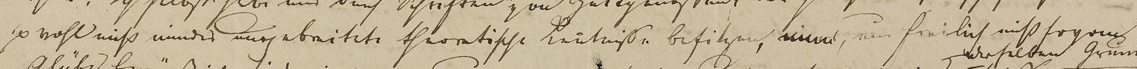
& wohl nicht minder ausgebreitete theoretische Kenntnisse besitzen, nur freilich nicht so vom
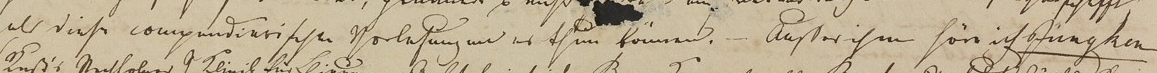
als diese compendiarischen Vorlesungen es thun können. – Ausser ihm höre ich Jüngken
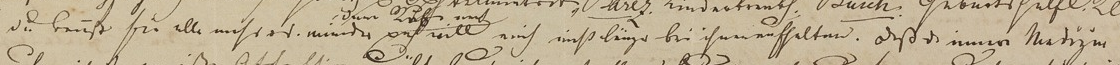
Du kennst sie alle mehr oder minder dem Rufe nach & ich will mich nicht länger bei ihnen aufhalten. dßd. innere Medizin
